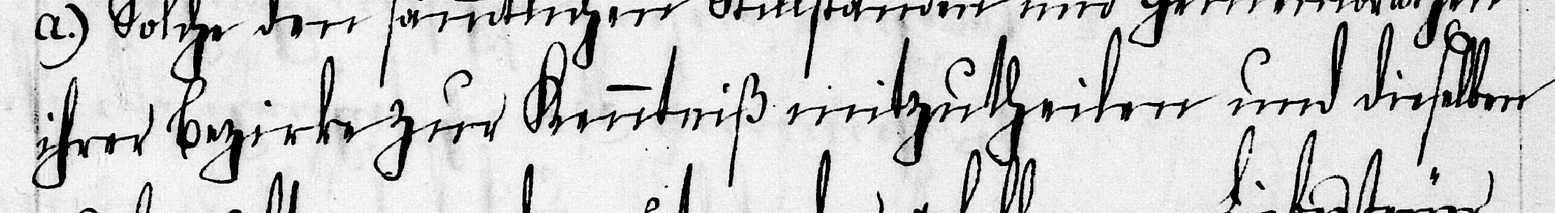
ihrer Bezirke zur Kenntniß mitzutheilen und dieselben
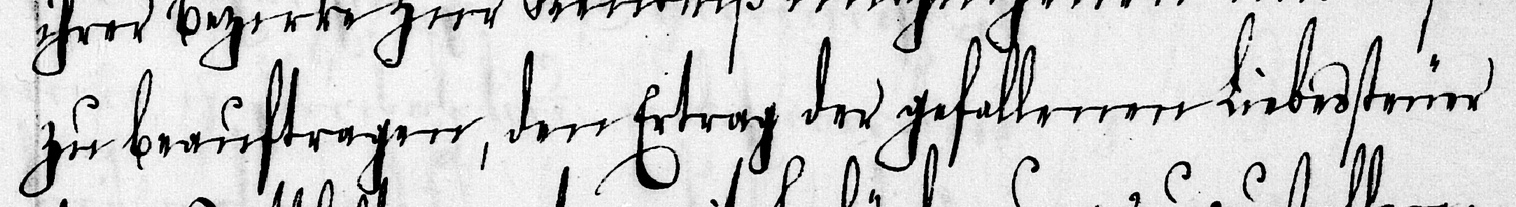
zu beauftragen, den Ertrag der gefallenen Liebessteuer
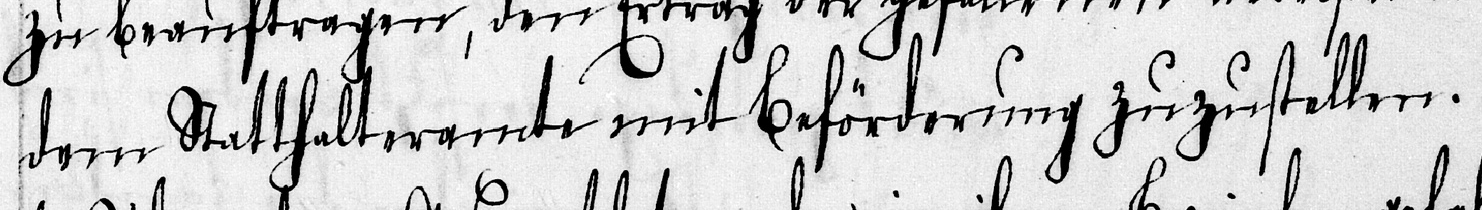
dem Statthalteramte mit Beförderung zuzustellen.
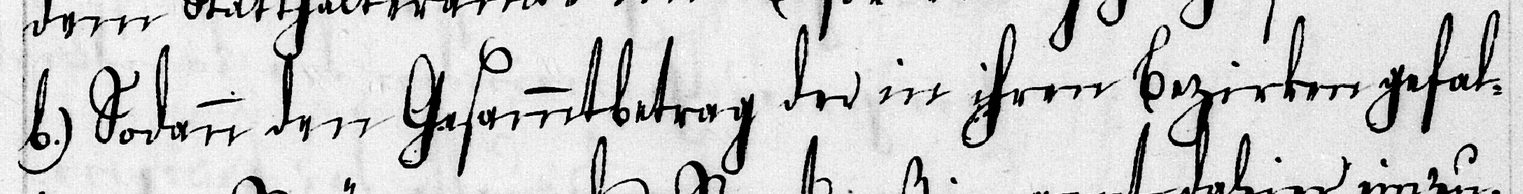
b.) Sodann den Gesammtbetrag der in ihren Bezirken gefal¬
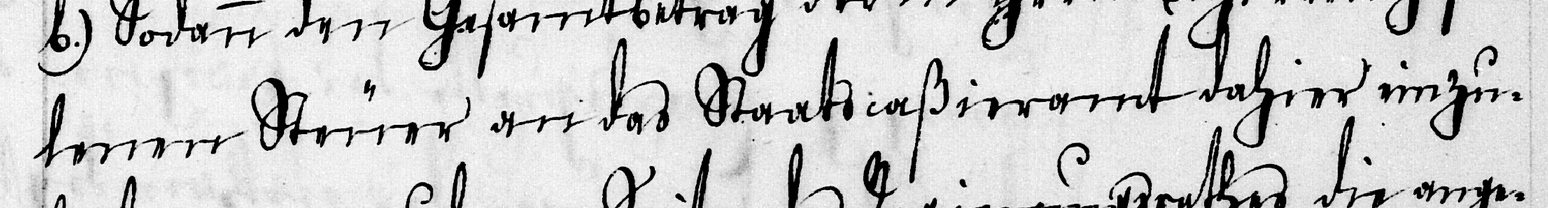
lenen Steuer an das Staatscaßieramt dahier einzu¬
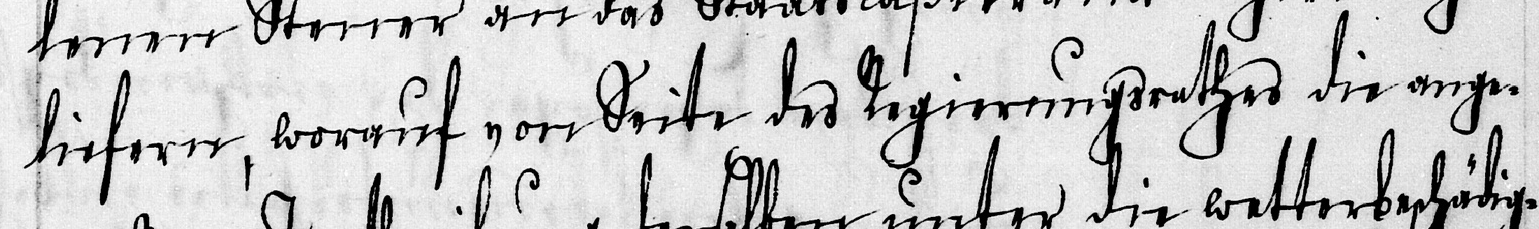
liefern, worauf von Seite des Regierungsrathes die ange¬
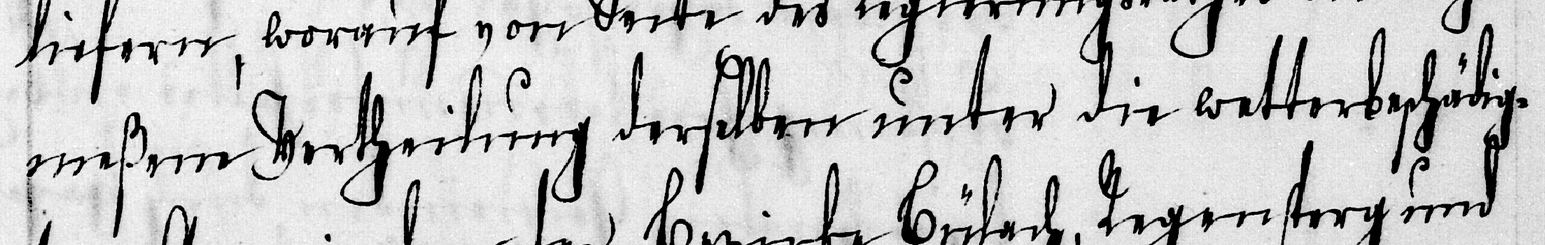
meßene Vertheilung derselben unter die wetterbeschädi¬
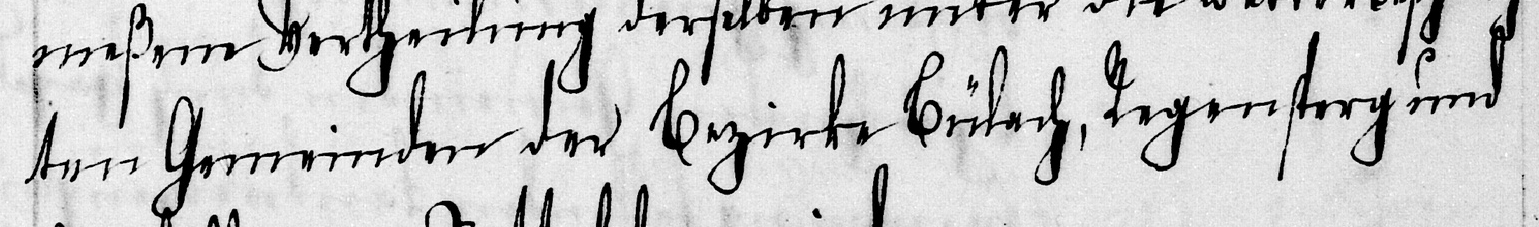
gten Gemeinden der Bezirke Bülach, Regensperg und
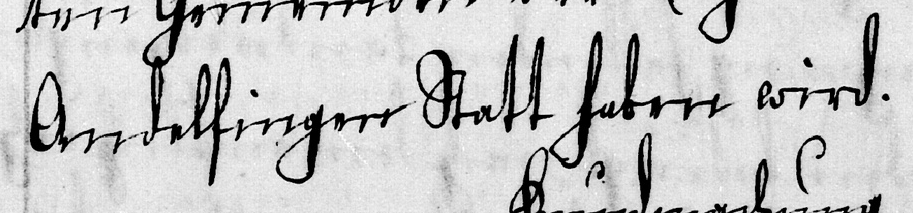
Andelfingen Statt haben wird.
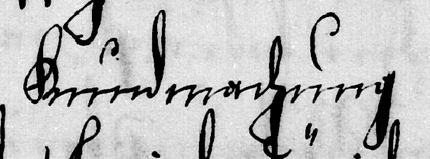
Kundmachung
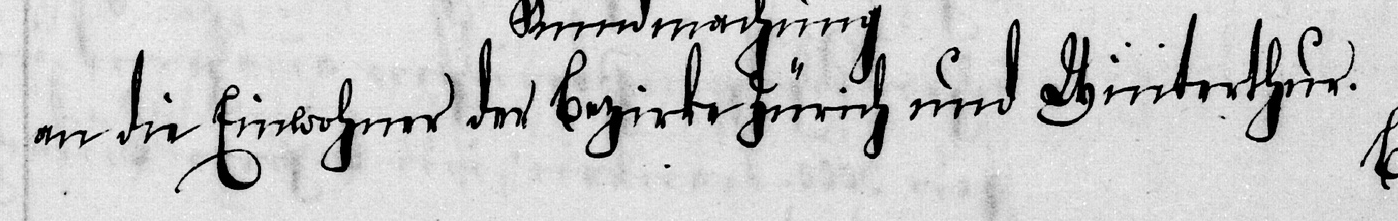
an die Einwohner der Bezirke Zürich und Winterthur.
